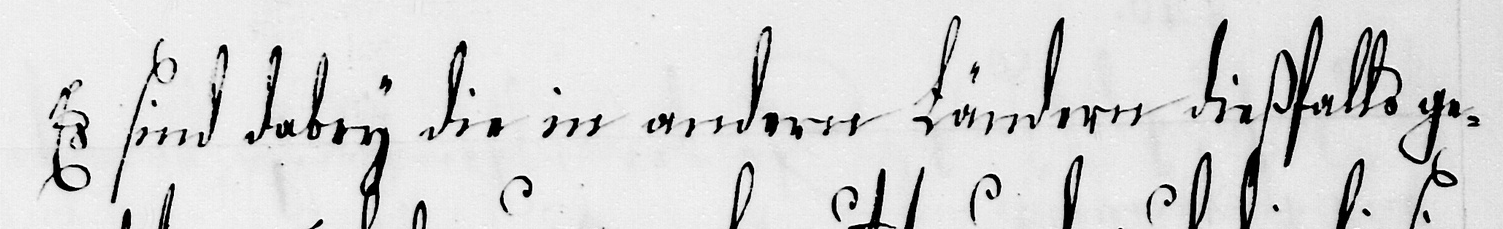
sind dabey die in andern Ländern dießfalls g¬
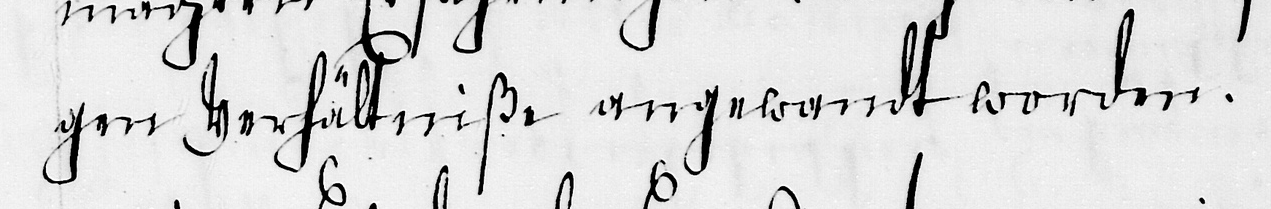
gen Verhältniße angewandt worden.
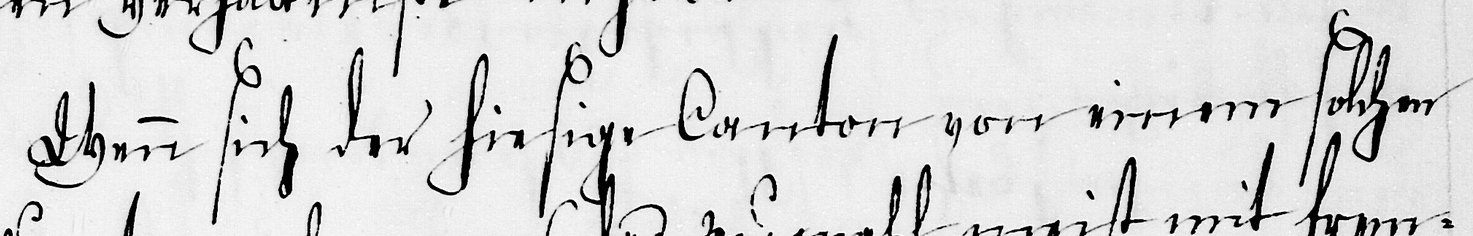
Wenn sich der hiesige Canton von einem solchen
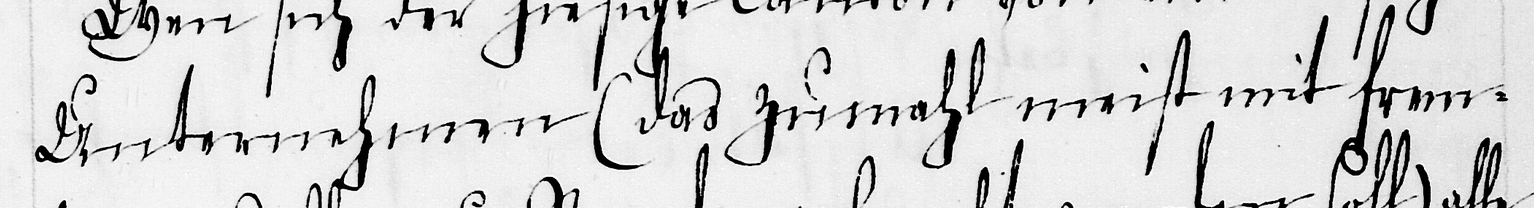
Unternehmen (das zumahl meist mit frem¬
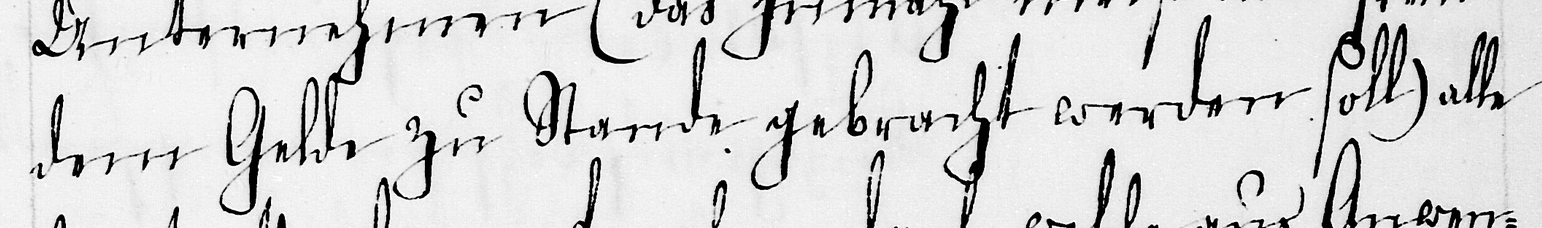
dem Gelde zu Stande gebracht werden soll) al¬
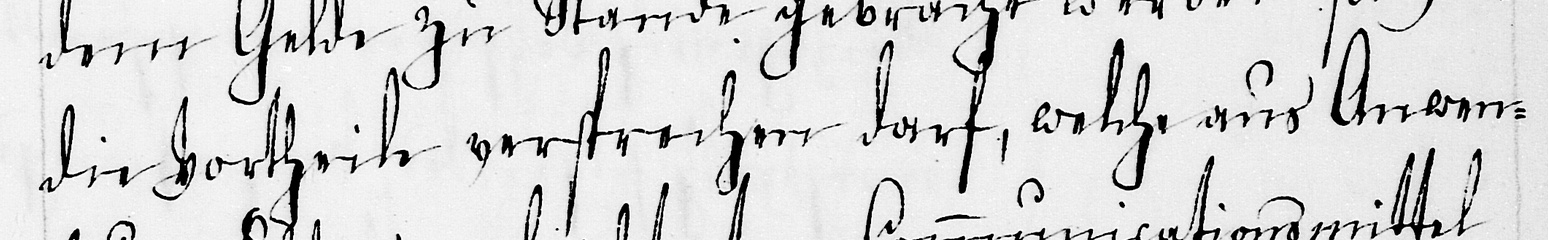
die Vortheile versprechen darf, welche aus Anwen¬
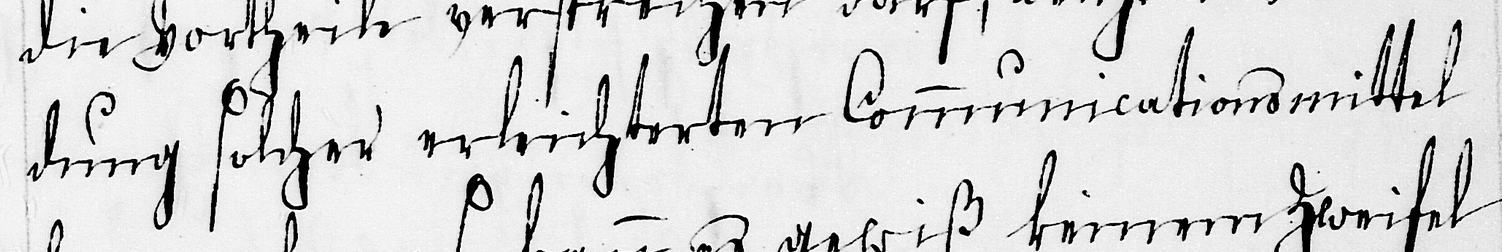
dung solcher erleichterten Communicationsmittel
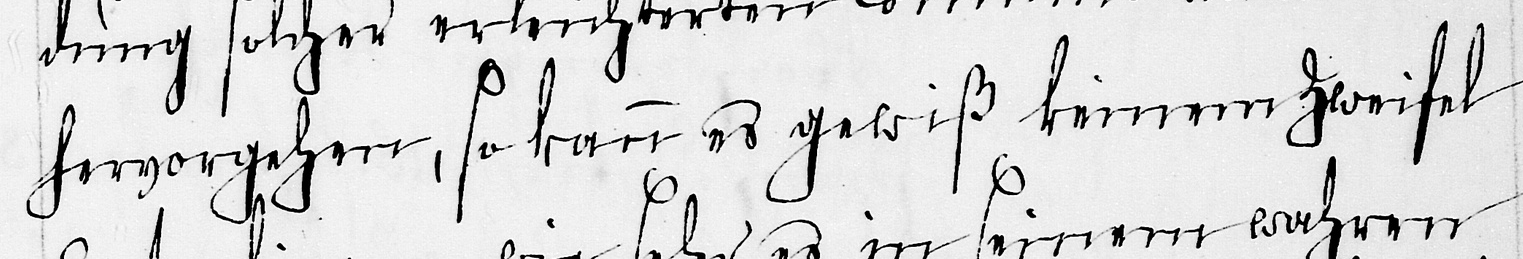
hervorgehen, so kann es gewiß keinem Zweifel
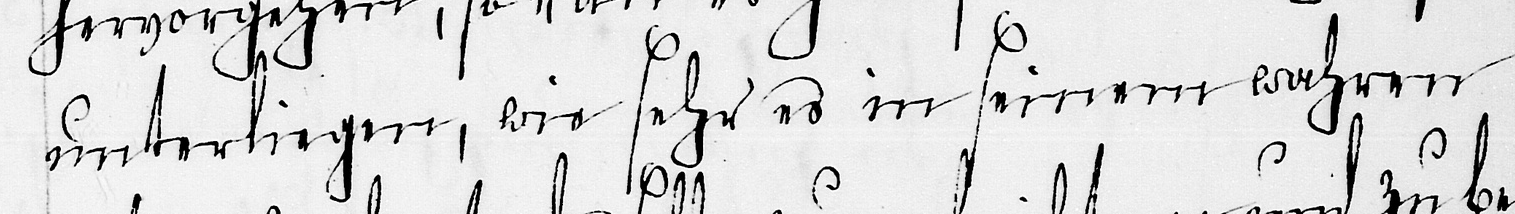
unterliegen, wie sehr es in seinem wahren
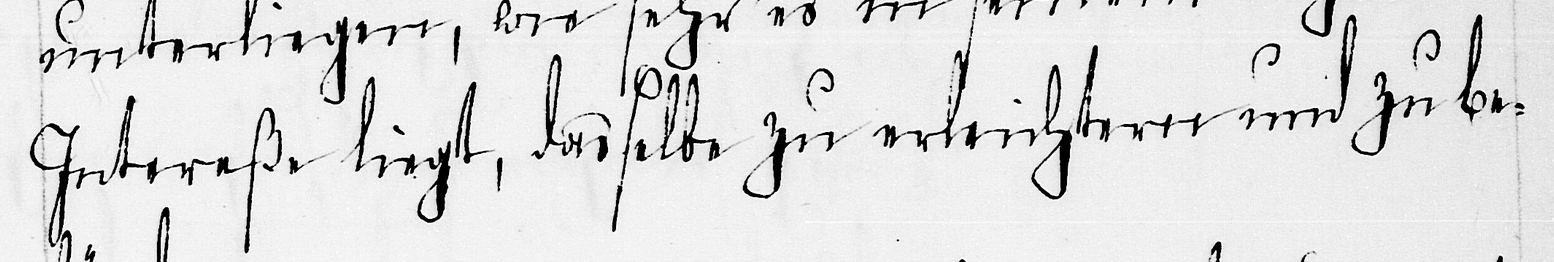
Intereße liegt, dasselbe zu erleichtern und zu be¬
